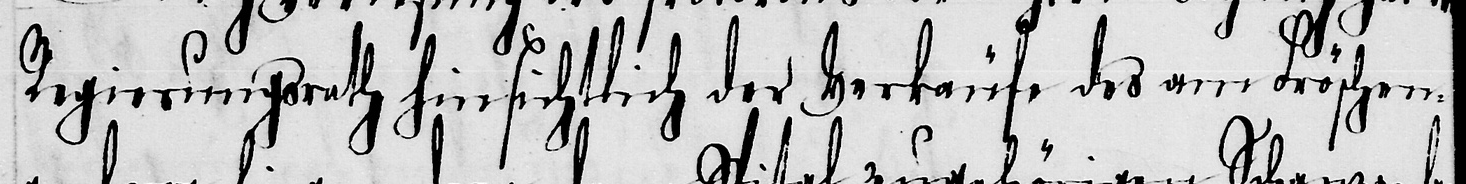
Regierungsrath hinsichtlich der Verkäufe des am Fröschen¬
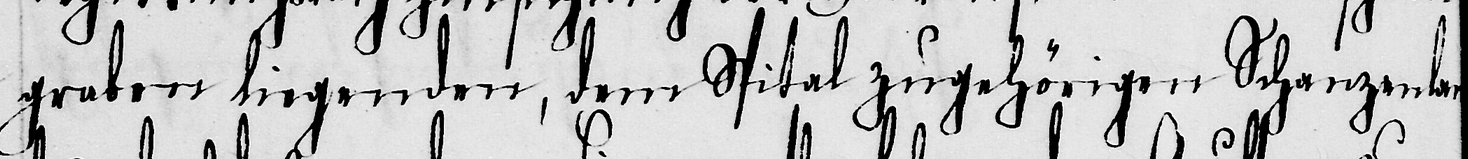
graben liegenden, dem Spital zugehörigen Schanzenlan¬
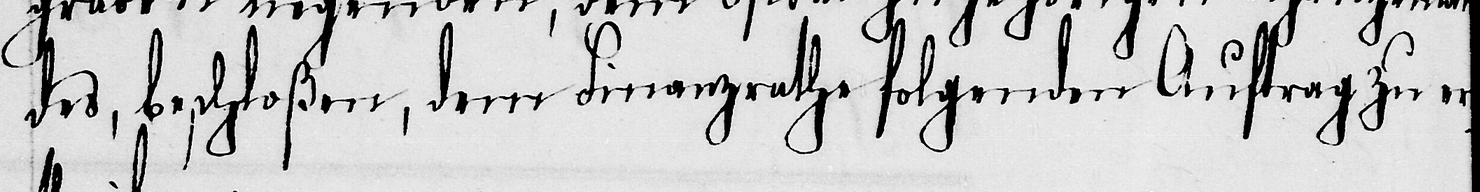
des, beschloßen, dem Finanzrathe folgenden Auftrag zu
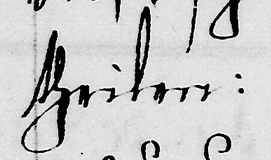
theilen:
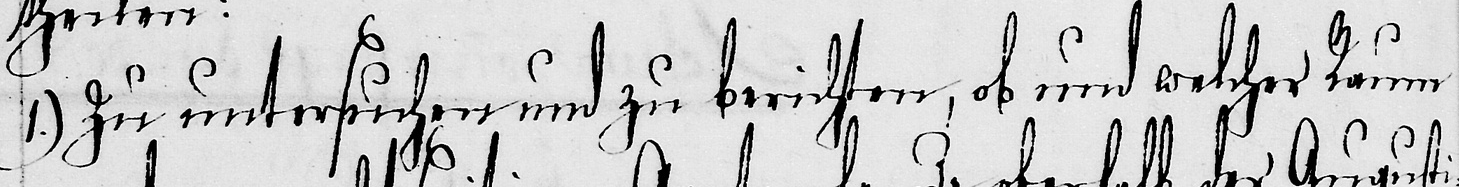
1.) Zu untersuchen und zu berichten, ob und welcher Raum
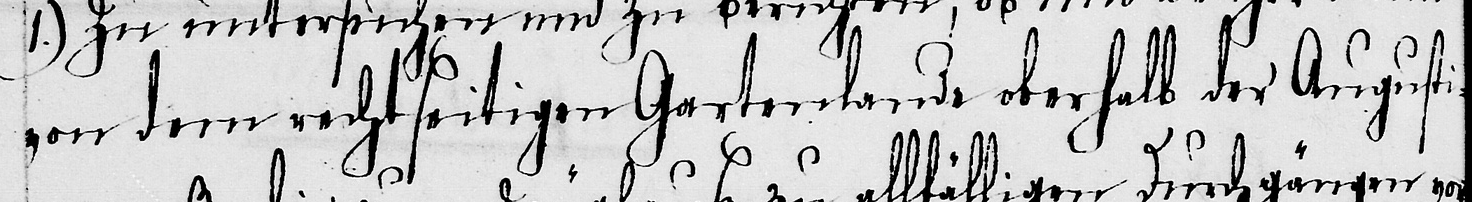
von dem rechtseitigen Gartenlande oberhalb der Augus¬
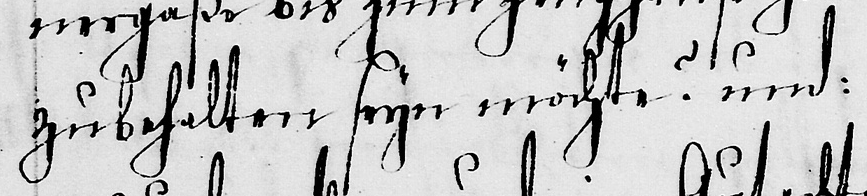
rzubehalten seyn möchte? und:
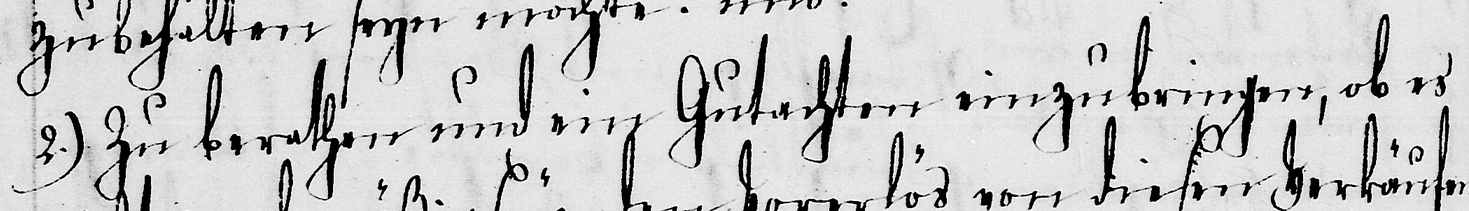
2.) Zu berathen und ein Gutachten einzubringen, ob es
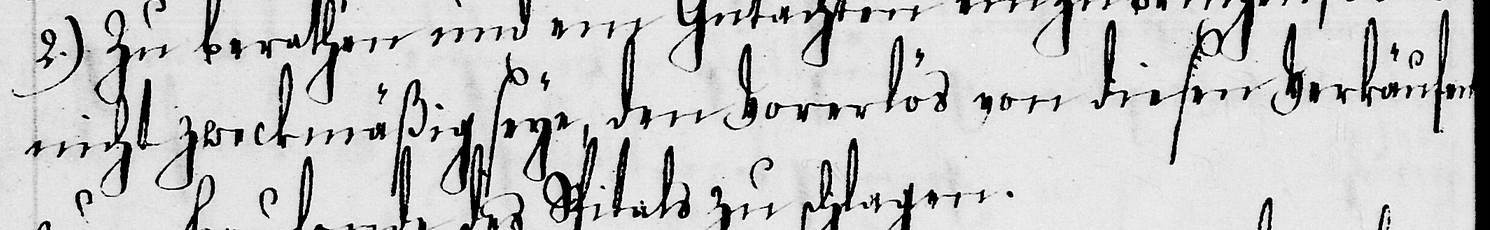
nicht zweckmäßig seye, den Vorerlös von diesen Verkäufen
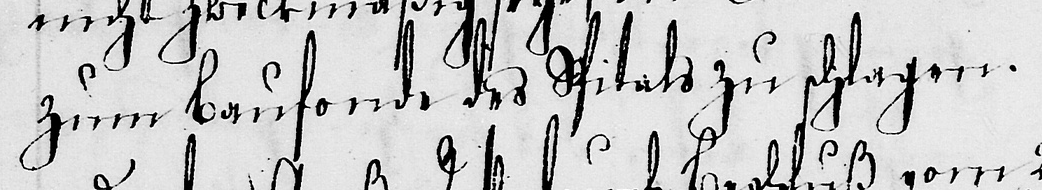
zum Baufonde des Spitals zu schlagen.
